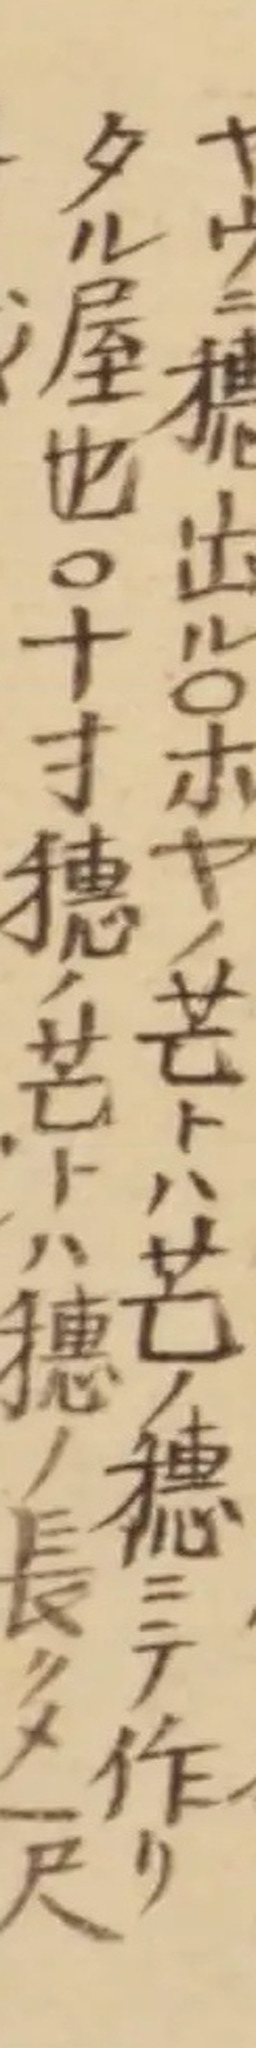タル屋也○十寸穂ノ芒トハ穂ノ長クシテ一尺
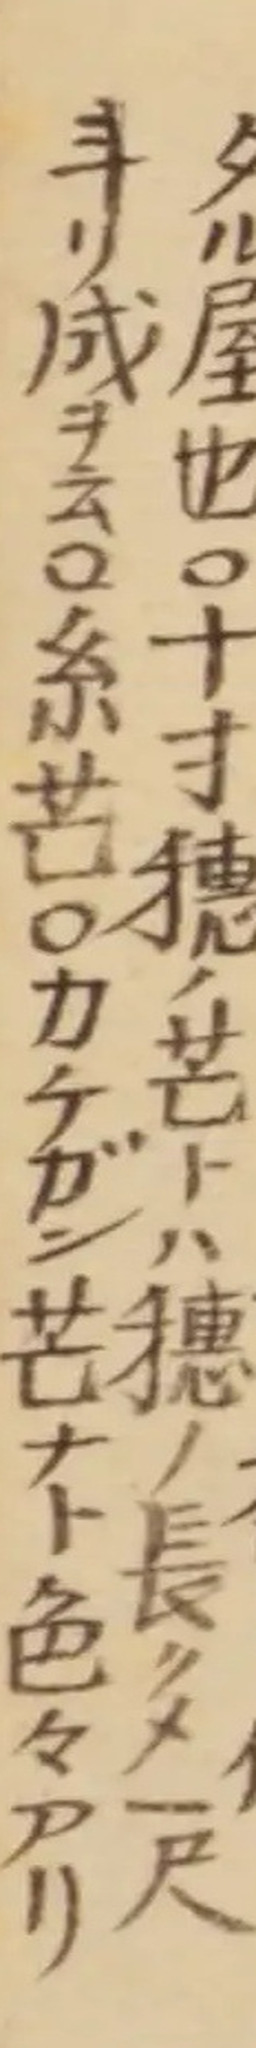斗リ成ヲ云○糸芒○カケガン芒ナト色々アリ

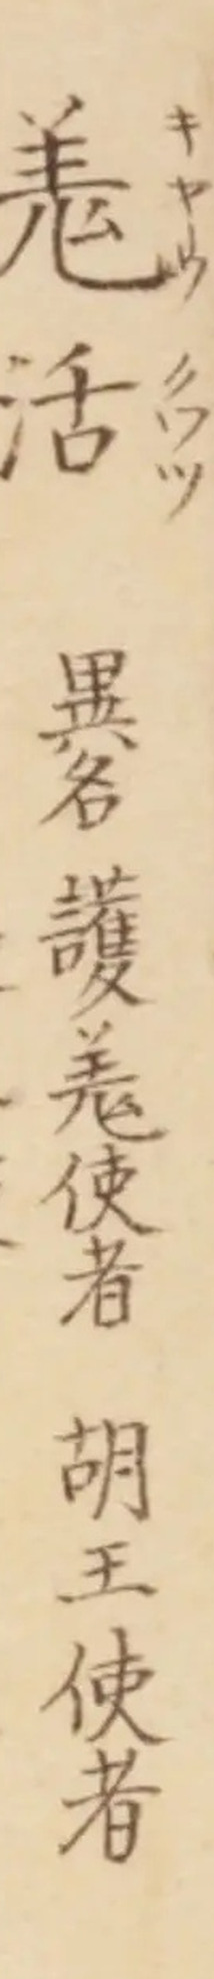羗活異名護羗使者胡王使者
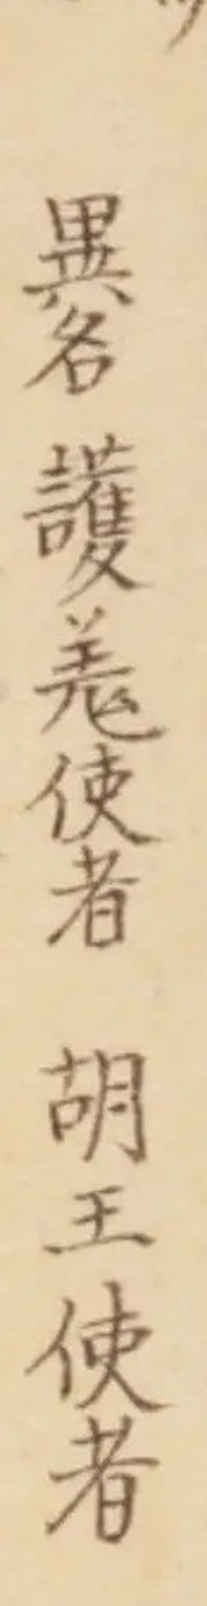羗活異名護羗使者胡王使者
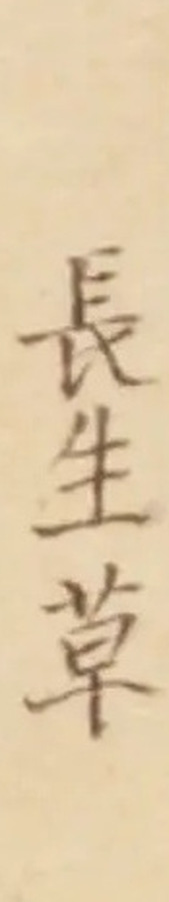長生草
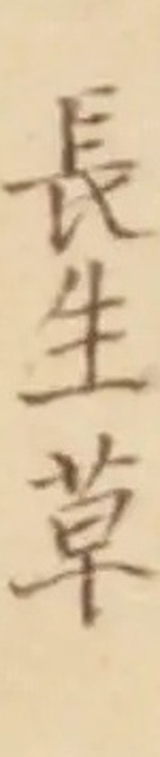長生草
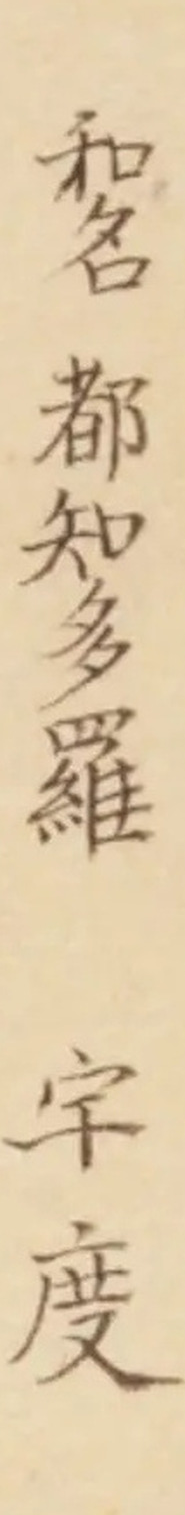和名都知多羅宇度
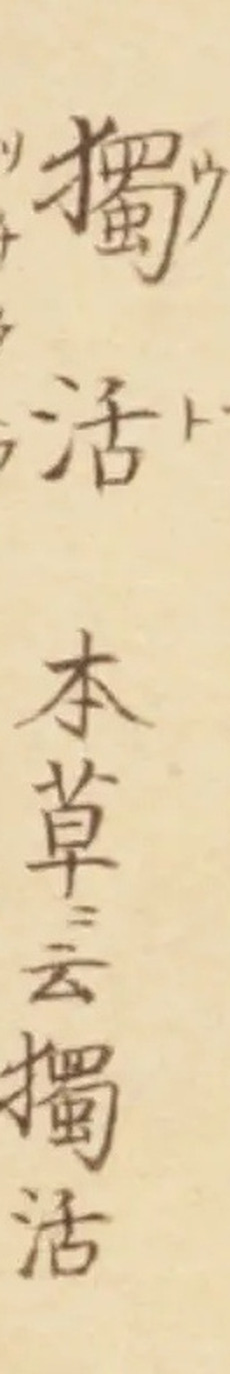独活本草云独活
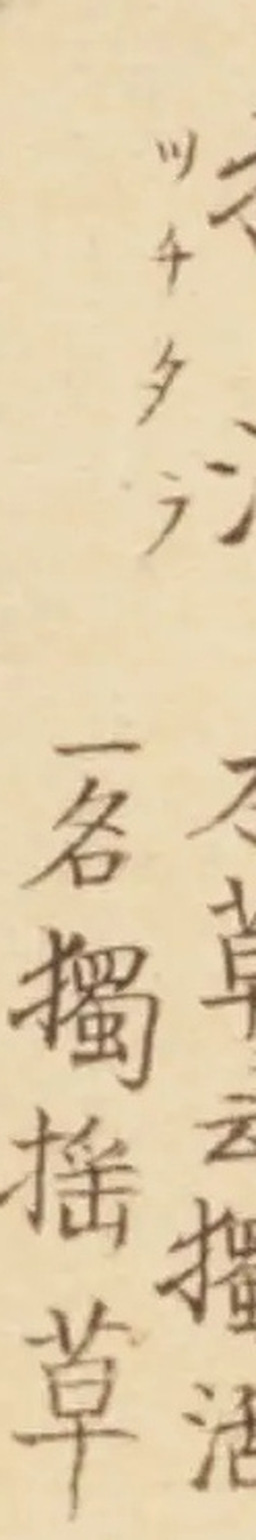一名独揺草
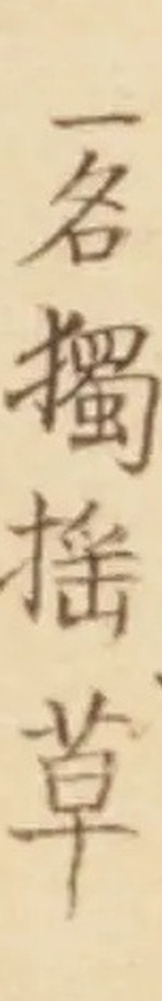一名独揺草
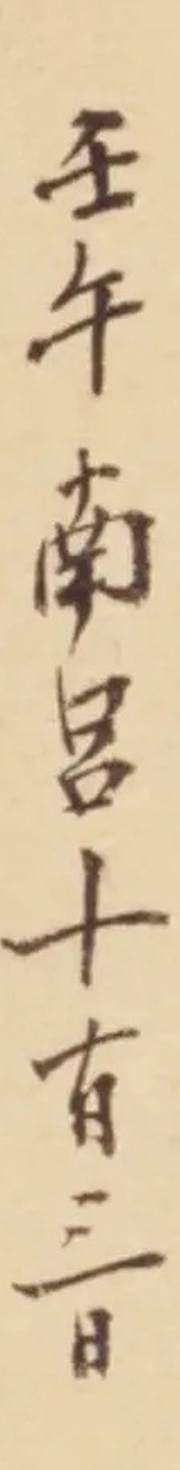壬午南呂十有三日
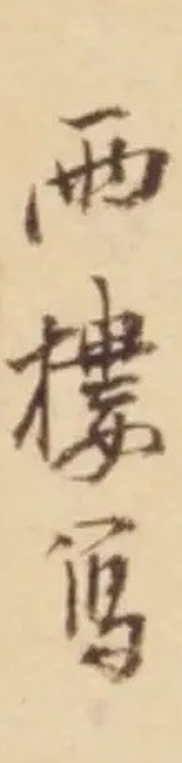雨楼写
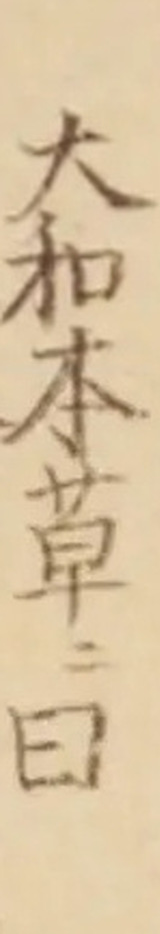大和本草曰
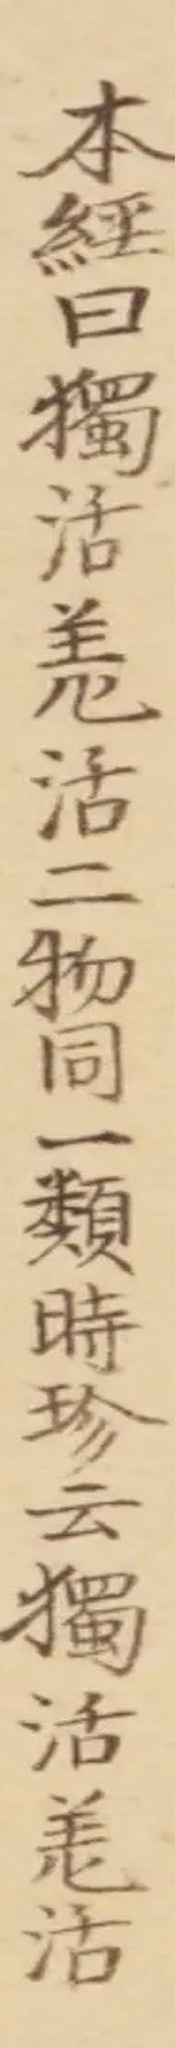本経曰独活羗活二物同一類時珍云独活羗活
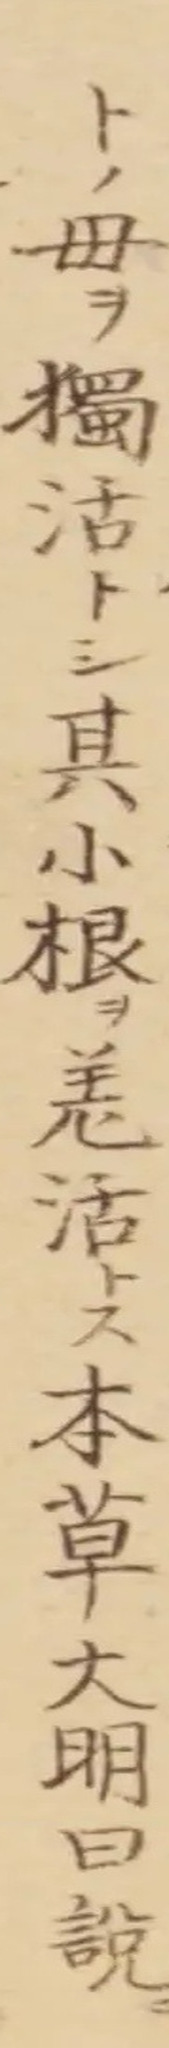トノ母ヲ独活トシ其小根羗活トス本草大明曰説
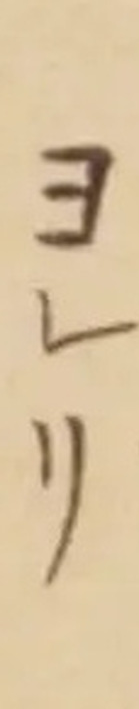ヨレリ
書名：梅園草木花譜秋之部. 1
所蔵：国立国会図書館 National Diet Library, JAPAN
